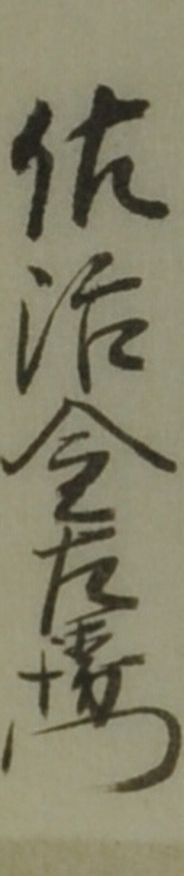佐治金左衛門
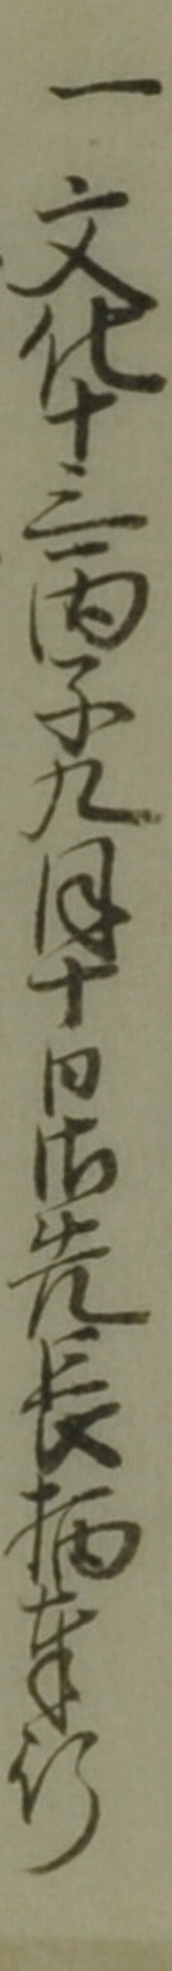一文化十三丙子九月十日御先長柄奉行
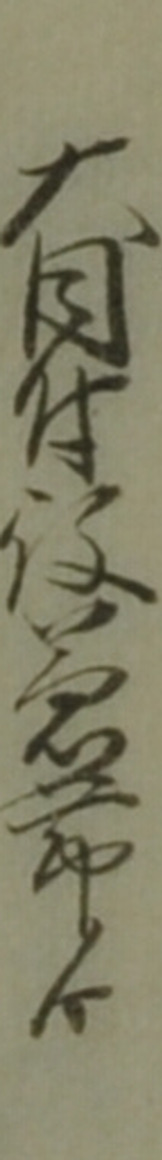大目付役兼帯ゟ
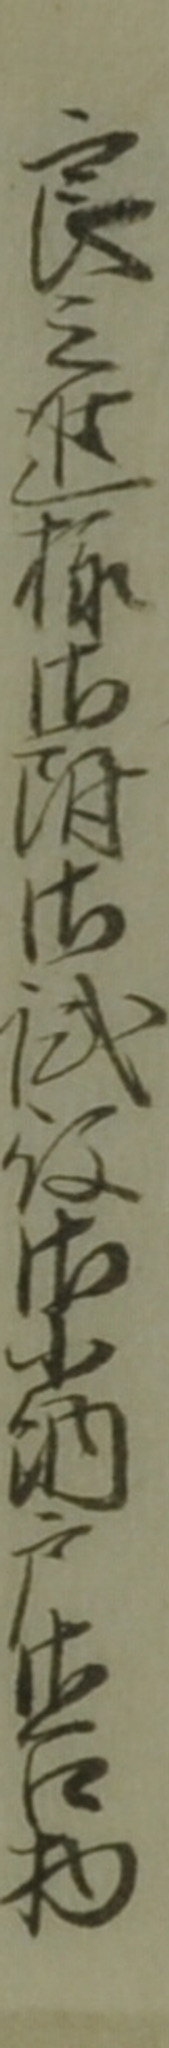良之進様御附御試役御小納戸御召物
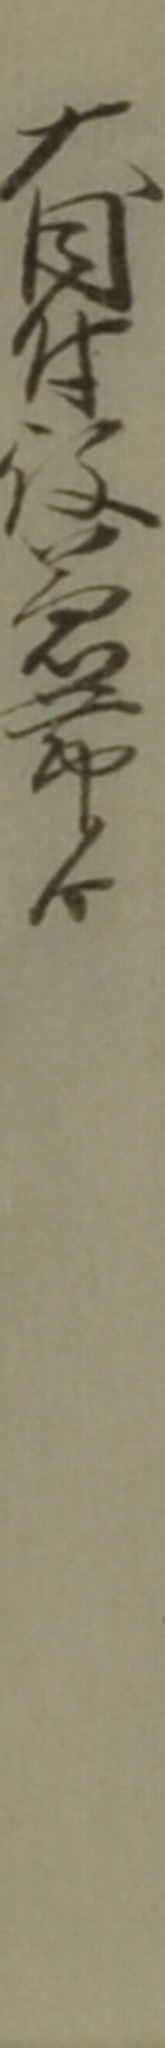大目付役兼帯ゟ
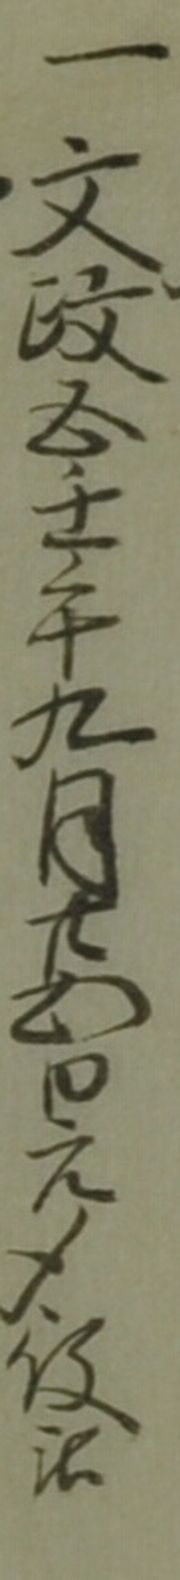一文政五壬午九月廿五日元〆役被
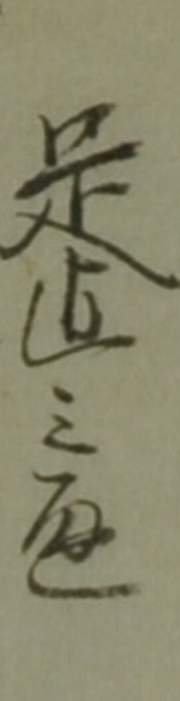是迄之通
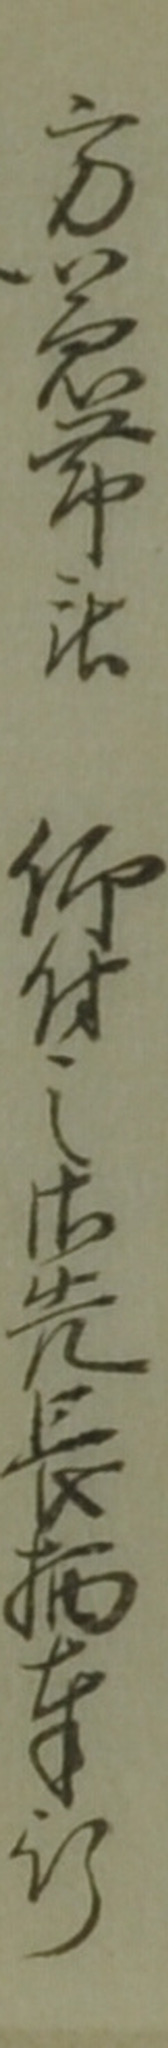方兼帯被仰付之御先長柄奉行
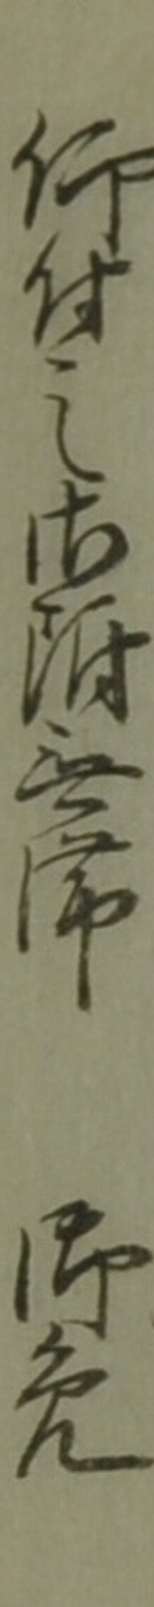仰付之御附無滞御免
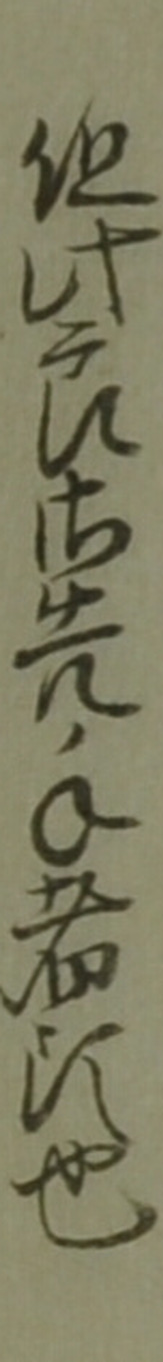但此節御先手者頭也
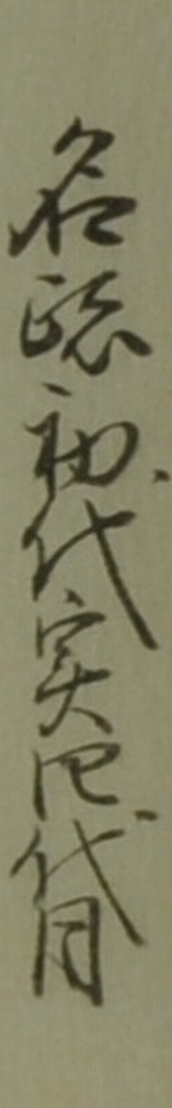名跡初代実四代目
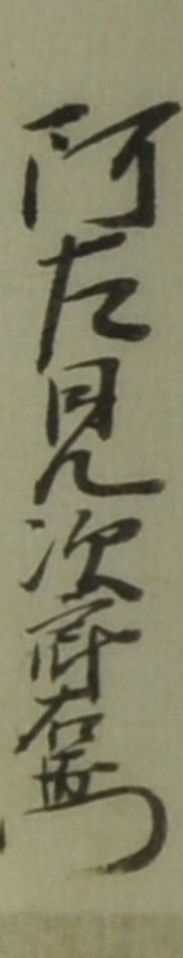阿左見次郎右衛門

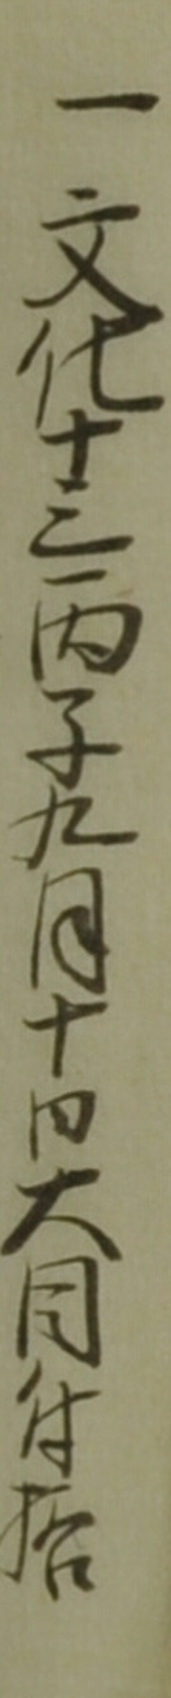一文化十三丙子九月十日大目付格
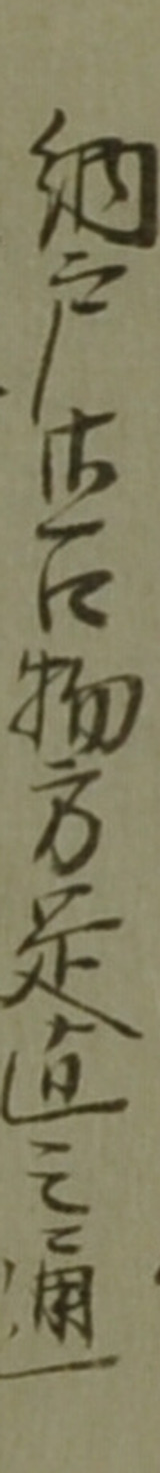納戸御召物方是迄之通
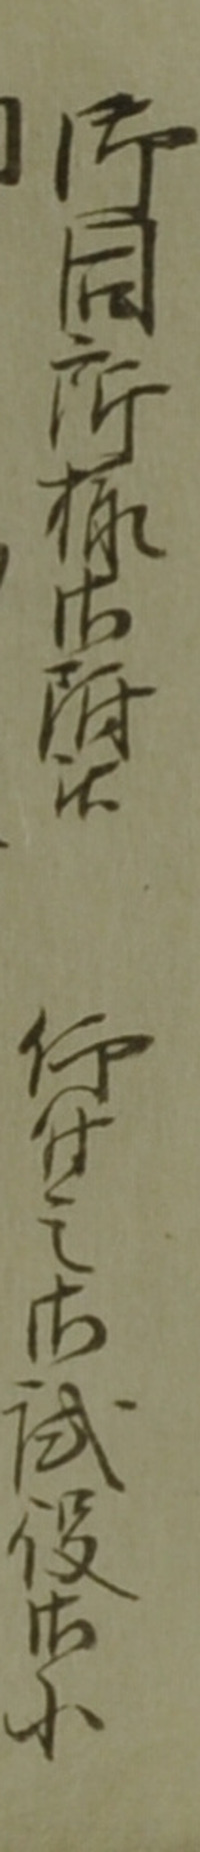御同所様御附被仰付之御試役御小
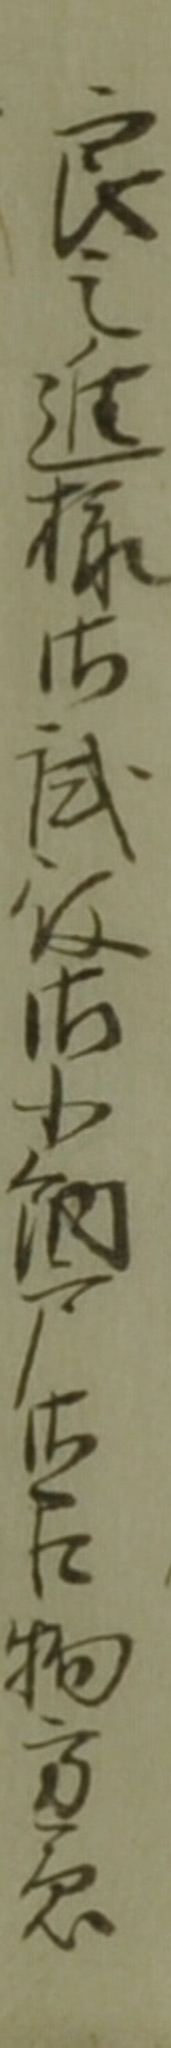良之進様御試役御小納戸御召物方兼
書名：諸御役代々録（六）
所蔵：伊那市立高遠町図書館・合同会社AMANE
